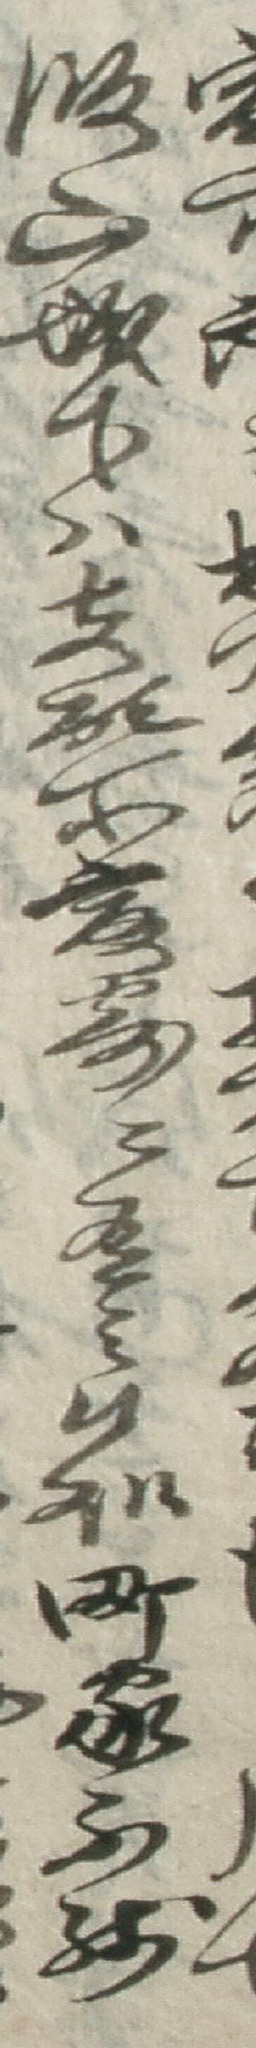飯山城下ハ支配所最寄二有之候処町家不残
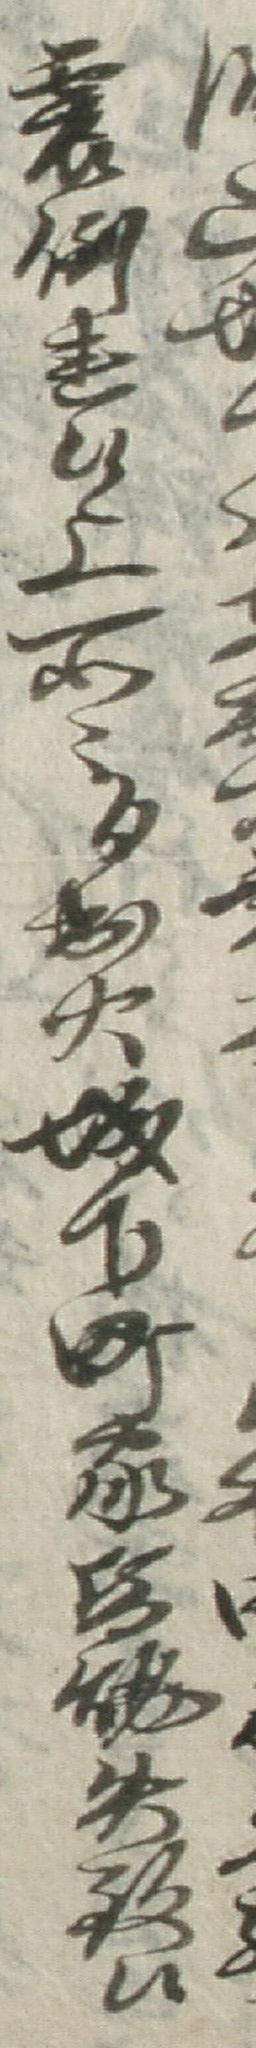震倒れ候上所々ゟ出火城下町家皆焼失致候
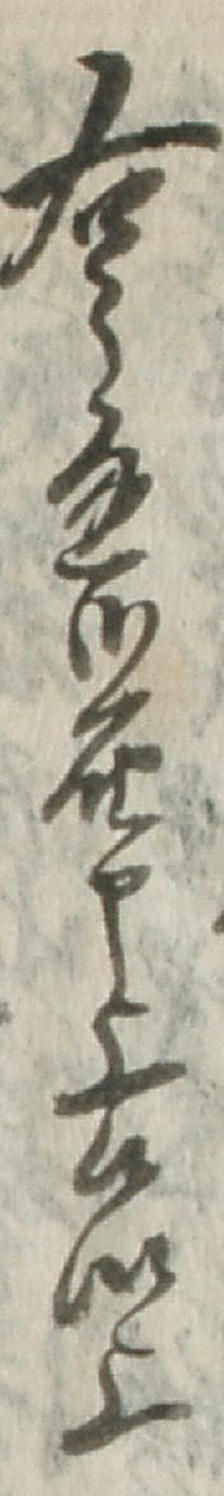右之通御届申上候以上
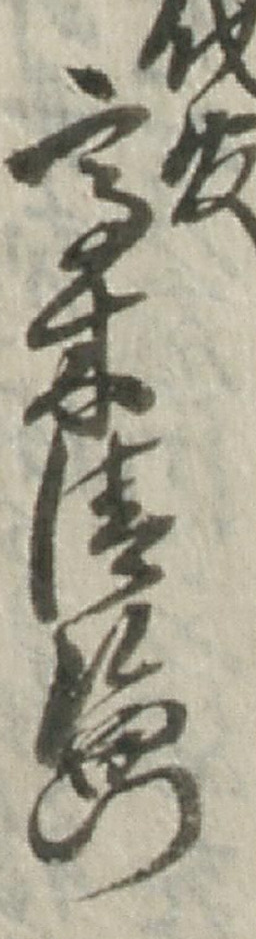高木清左衛門
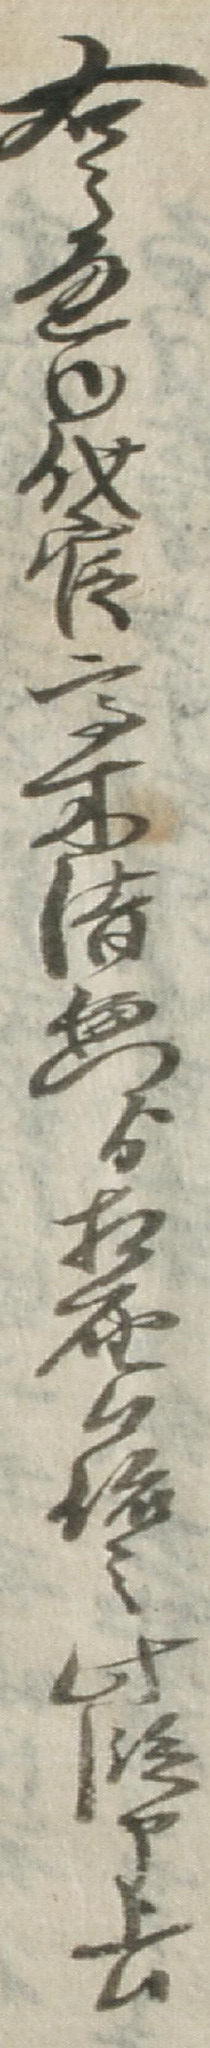右之通御代官高木清左衛門ゟ相届候依之此段申上候
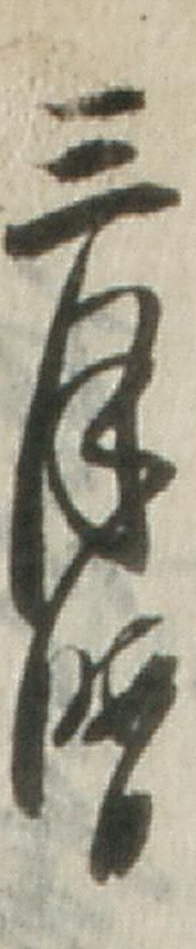三月晦日
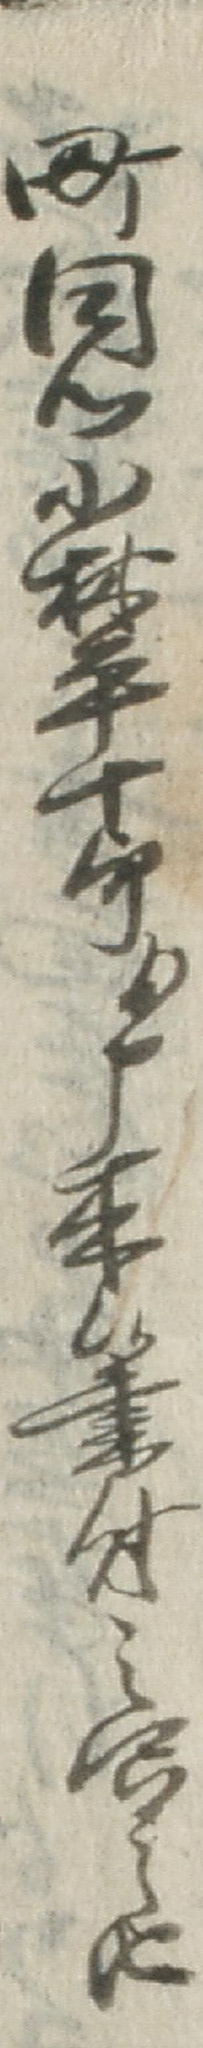一町同心小林平十郎ゟ申来候書付之写之由
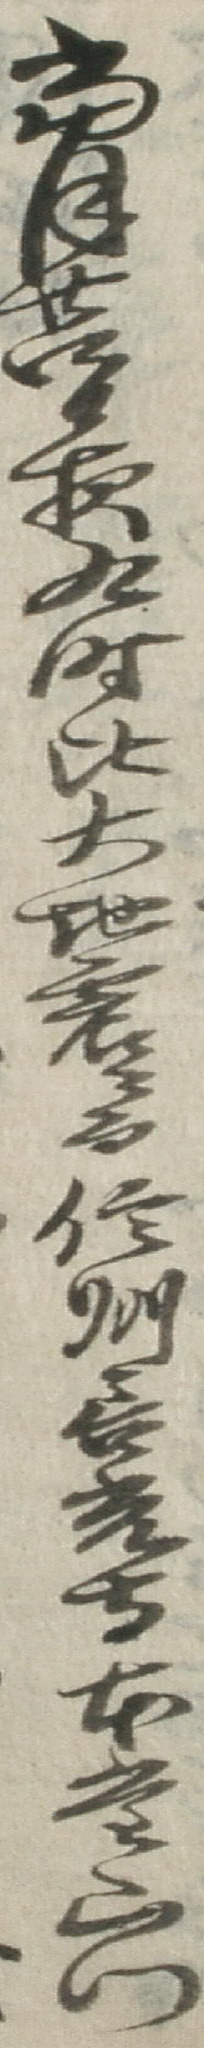当月廿四日夜九ッ時比大地震二而信州善光寺本堂山門
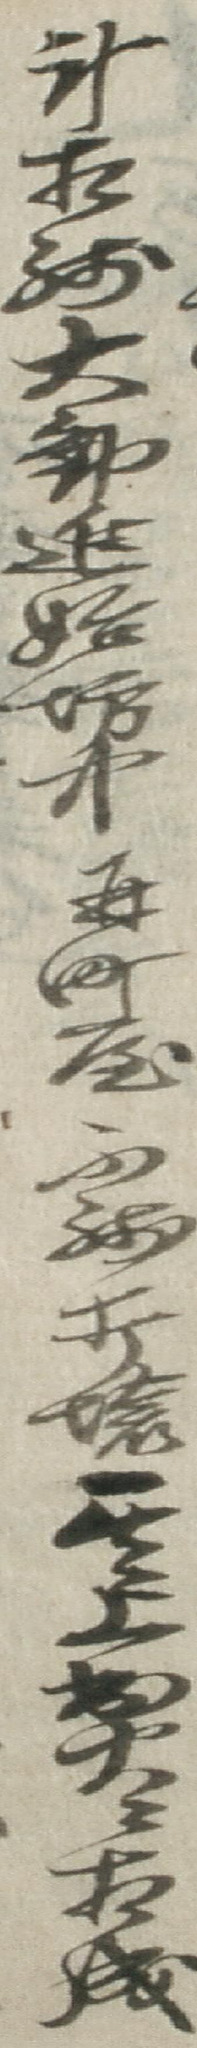計相残大勧進始坊中并町屋不残打壊其上出火二相成
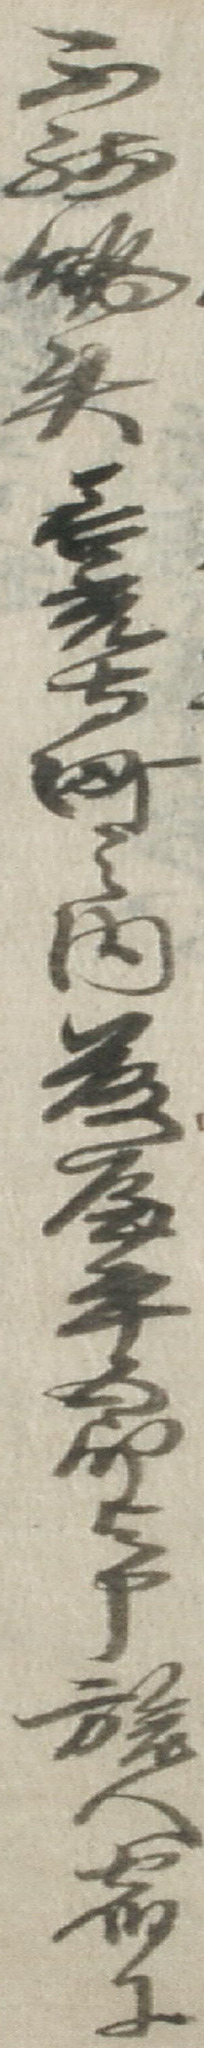不残焼失善光寺町之内藤屋平五郎と申旅人宿に
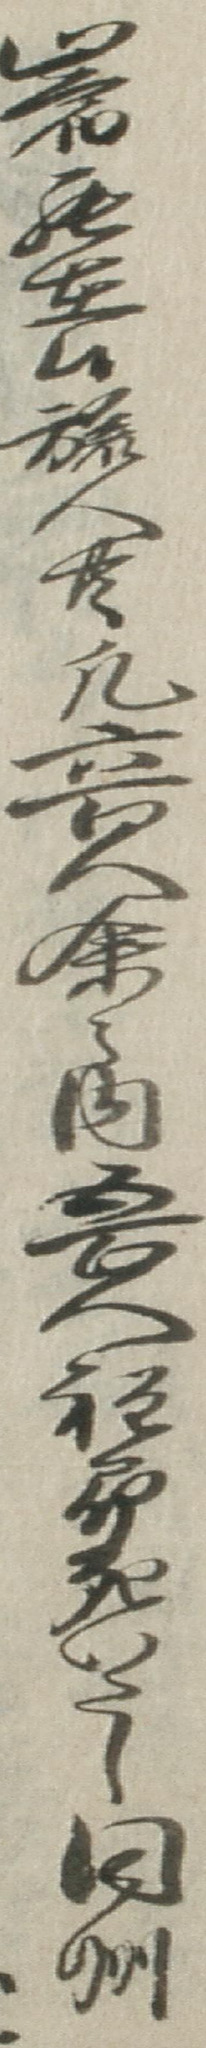止宿罷在候旅人共凡六百人余之内五百人程即死いたし同州
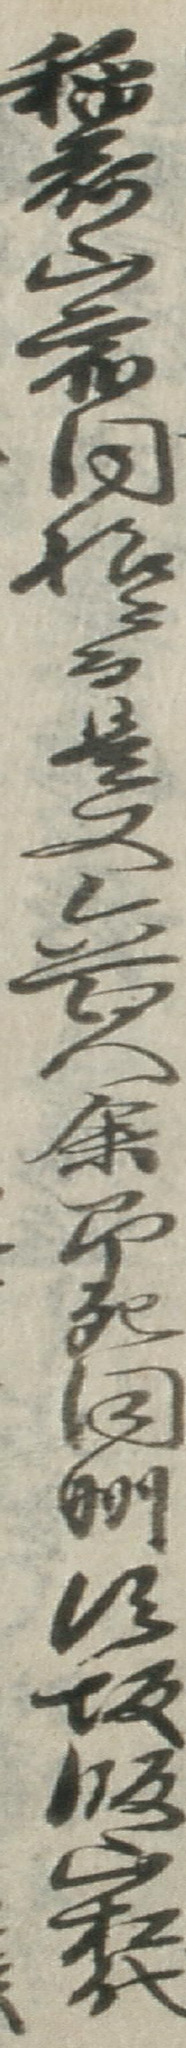稲荷山宿同様二而是又六百人余即死同州須坂飯山松代
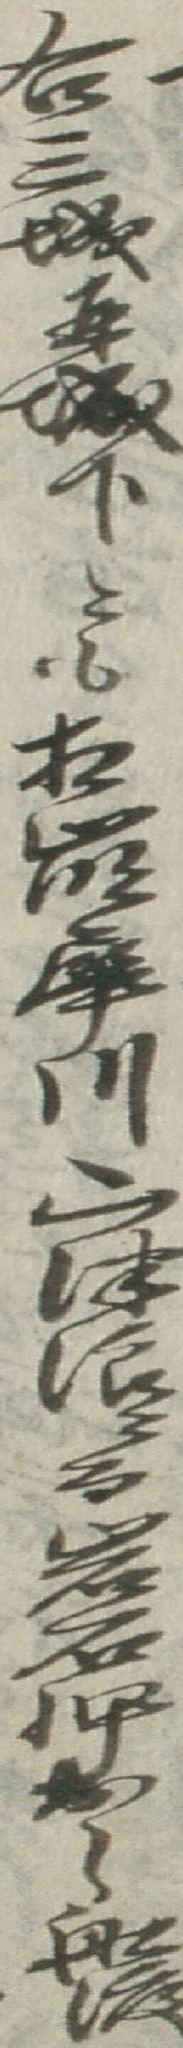右三城并城下とも相崩犀川山津浪二而岩石押出し船渡
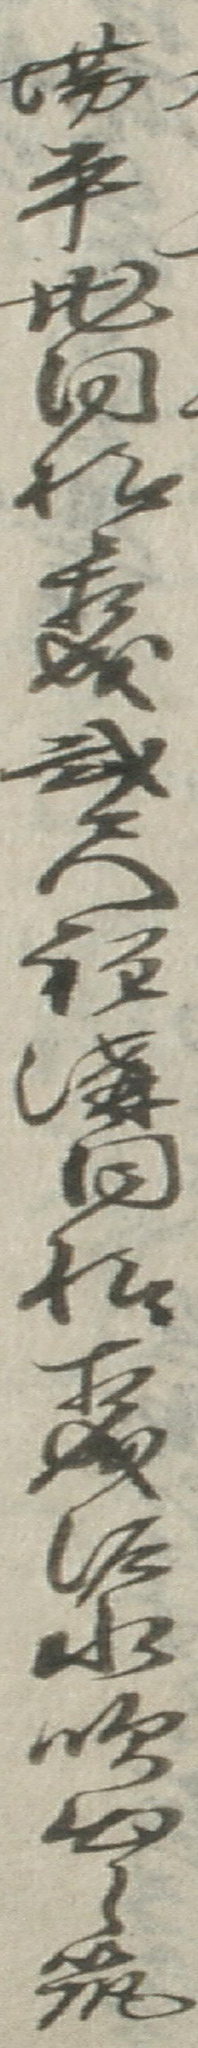場平地同様二相成弐尺程溝同様相成泥水吹出し筑
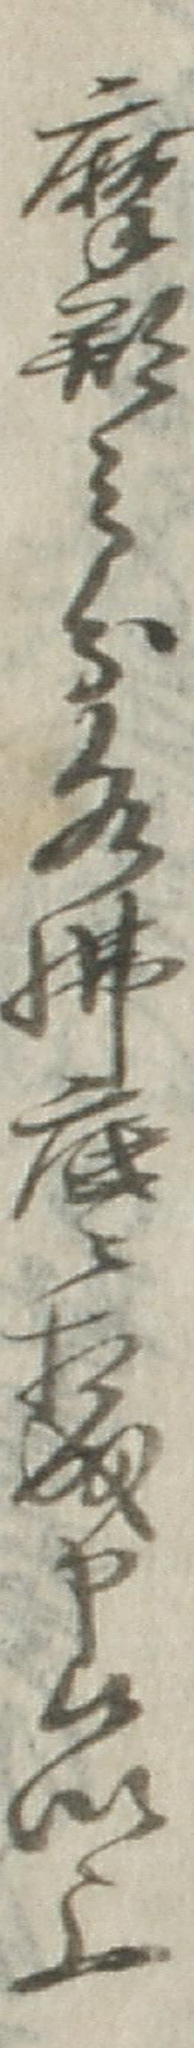摩郡之分水払底二相成申候以上
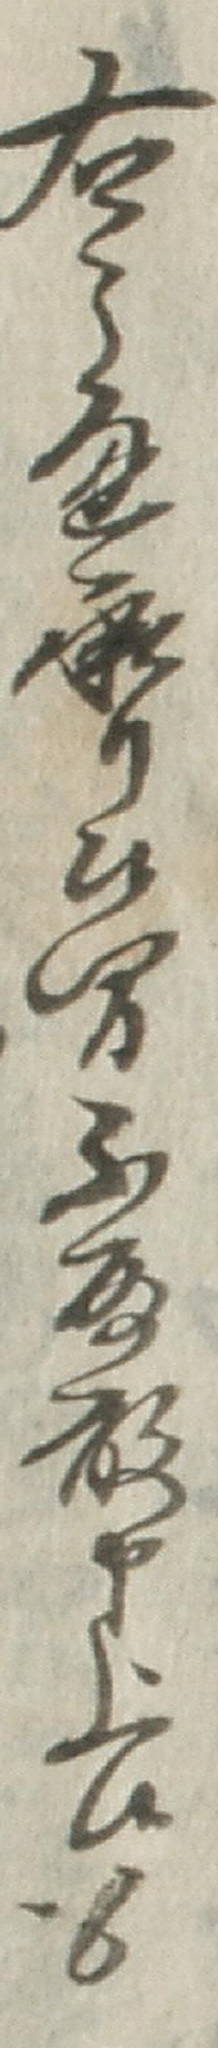右之通承り候間不取敢申上候以上
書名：信濃國地震實録記
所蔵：東京大学地震研究所図書室 Earthquake Research Institute Library, The University of Tokyo, JAPAN
